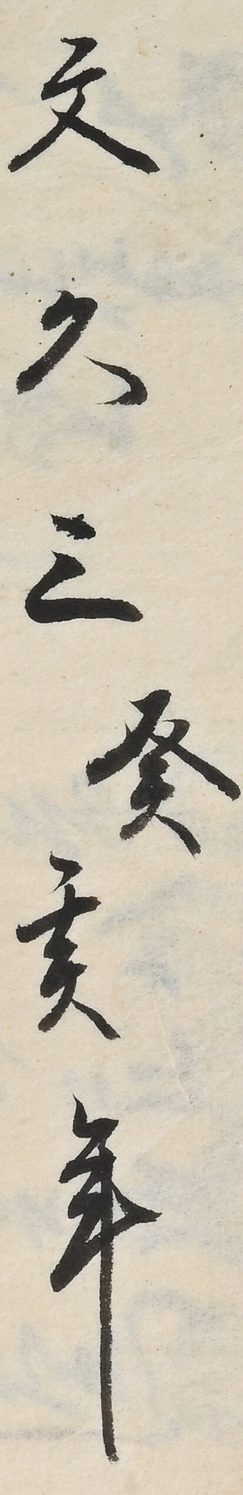文久三癸亥年
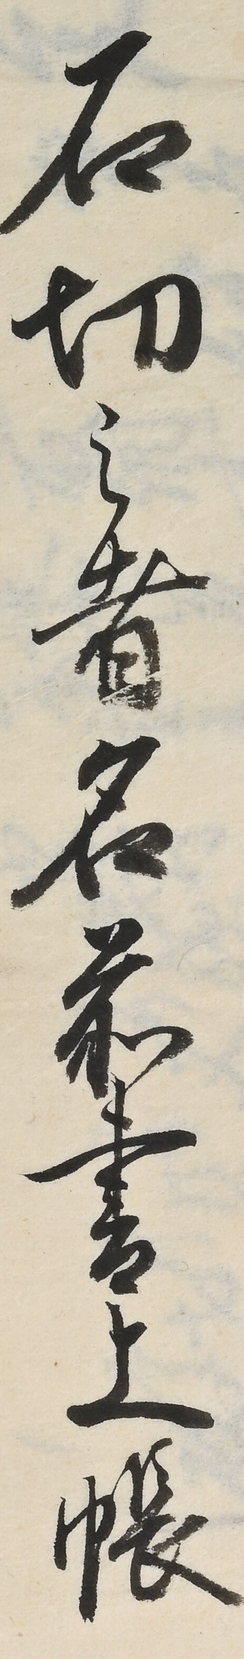石切之者名前書上帳
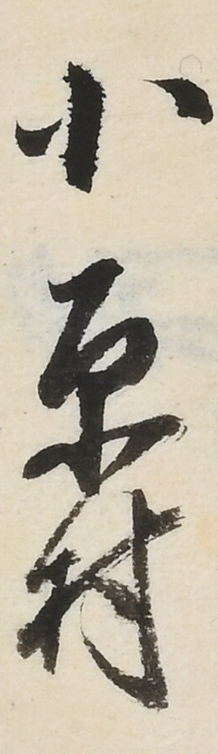小原村

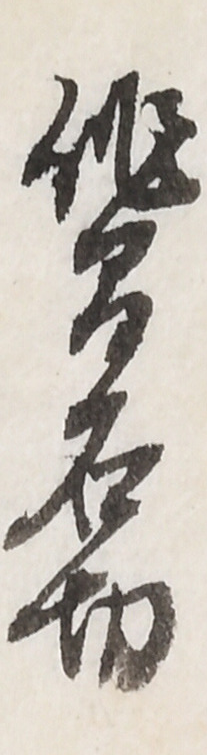作間石切
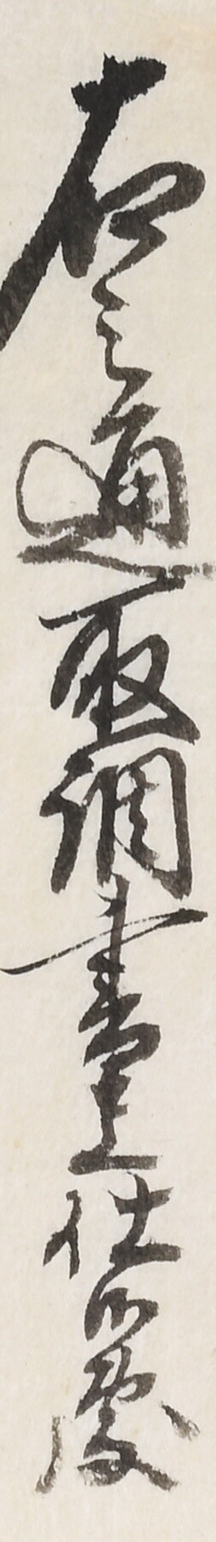右之通取調書上仕候処
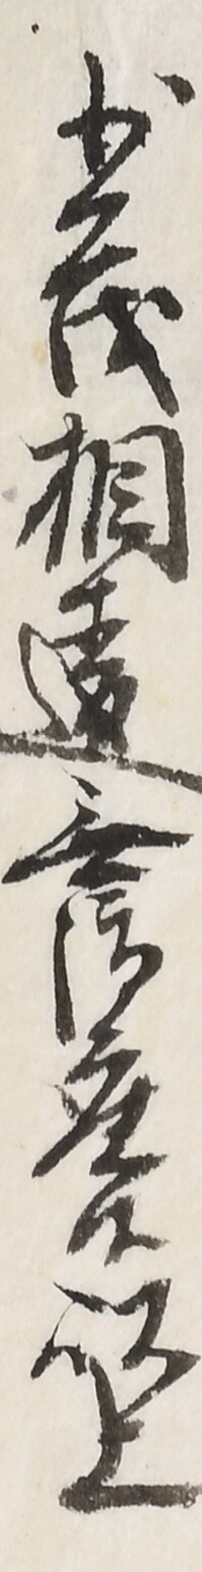少茂相違無御座候以上
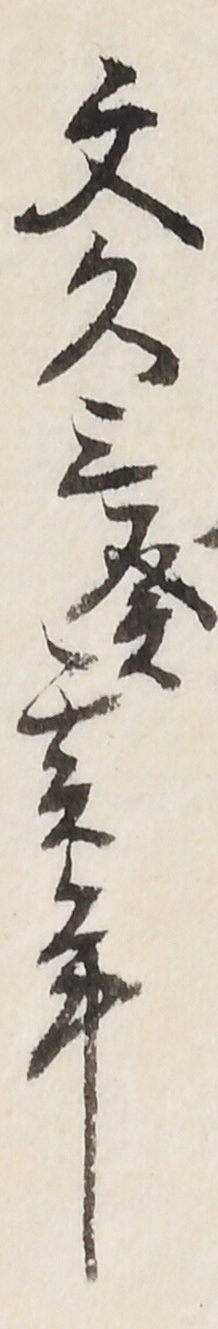文久三癸亥年
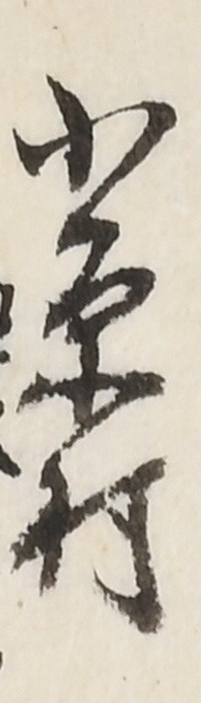小原村
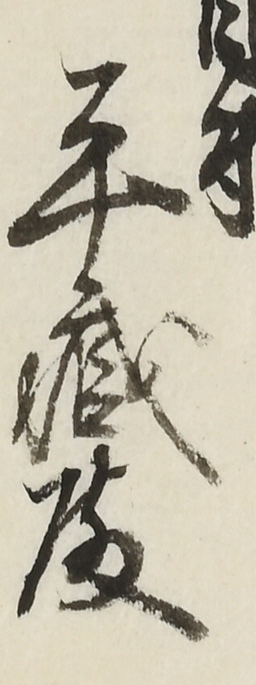平蔵殿
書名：文久三癸亥年石切之者名前書上帳
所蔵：伊那市立高遠町図書館・合同会社AMANE
